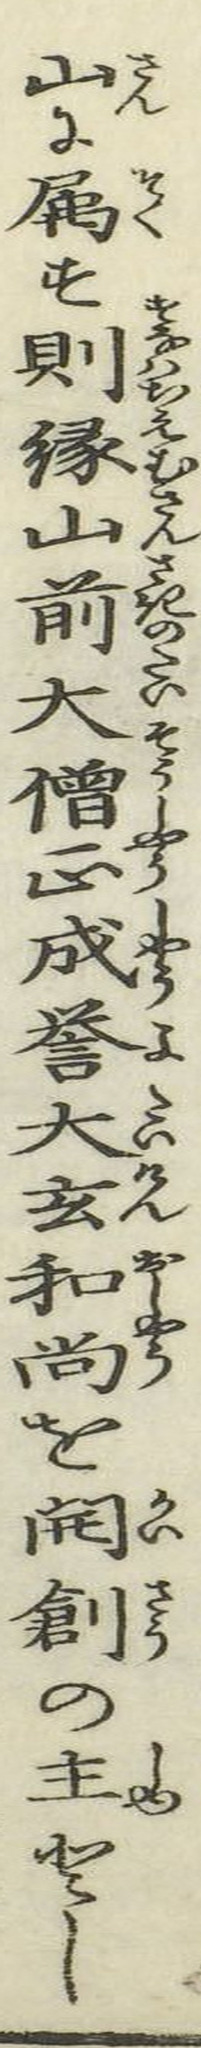山に属す則縁山前大僧正成誉大玄和尚を開創の主とし
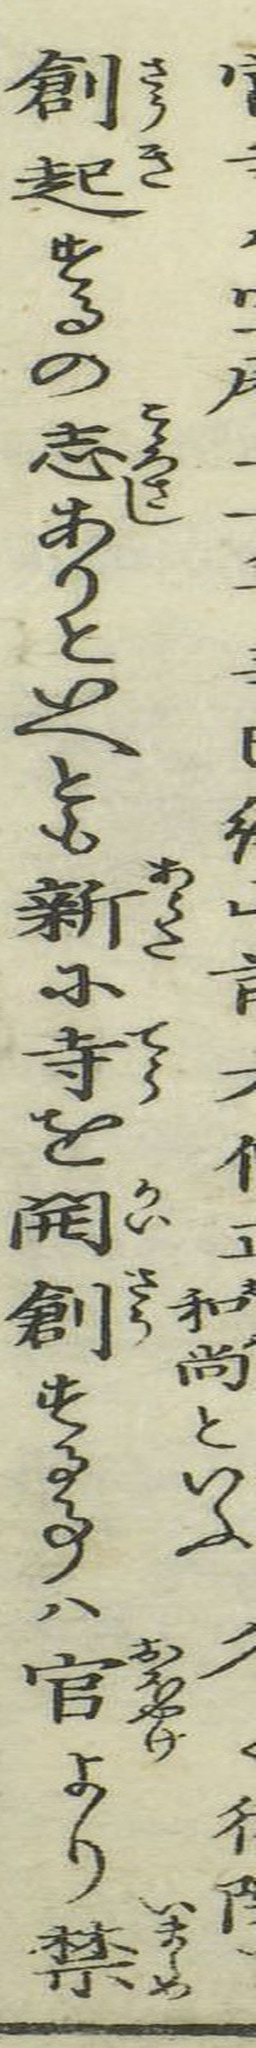創起するの志ありといへとも新に寺を開創する事は官より禁

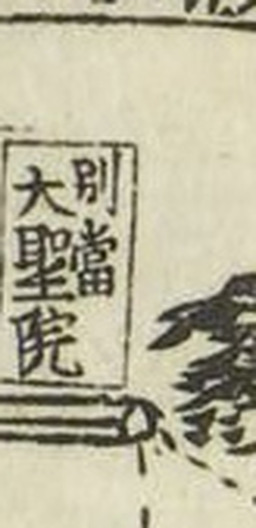大聖院

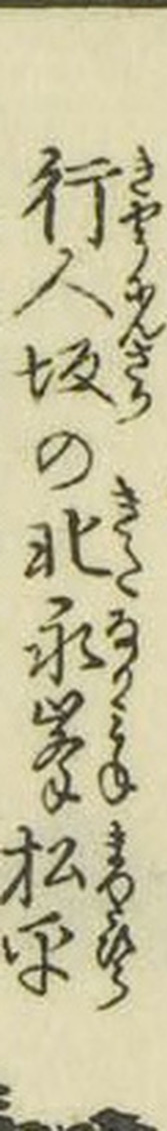行人坂の北永峯松平
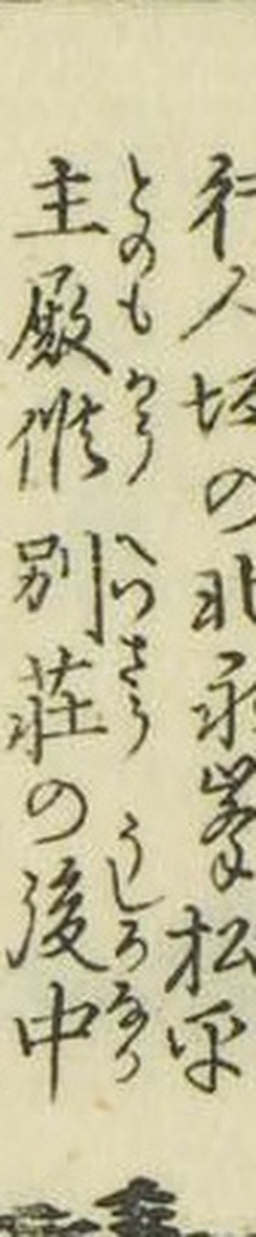主殿侯別荘の後中
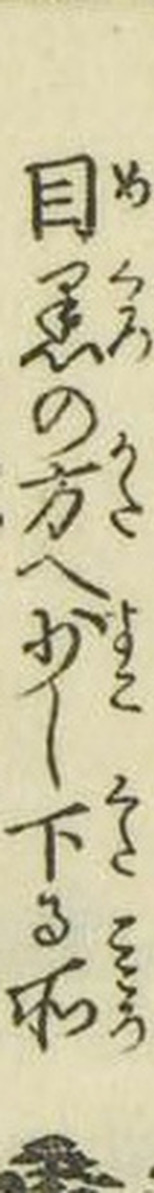目黒の方へ少し下る所
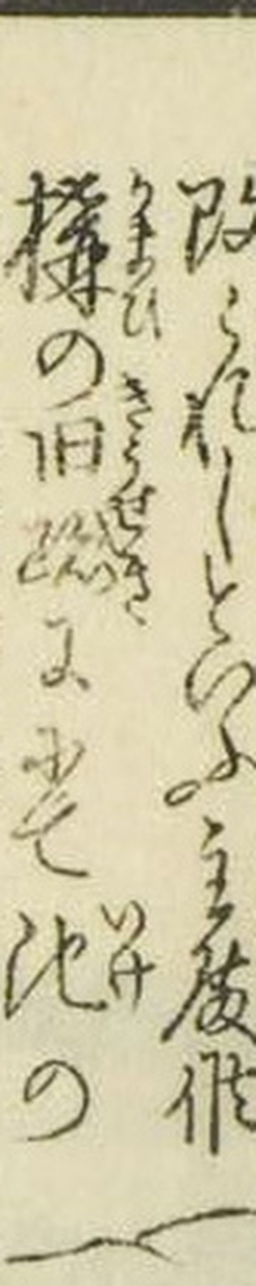構の旧跡ににて池の
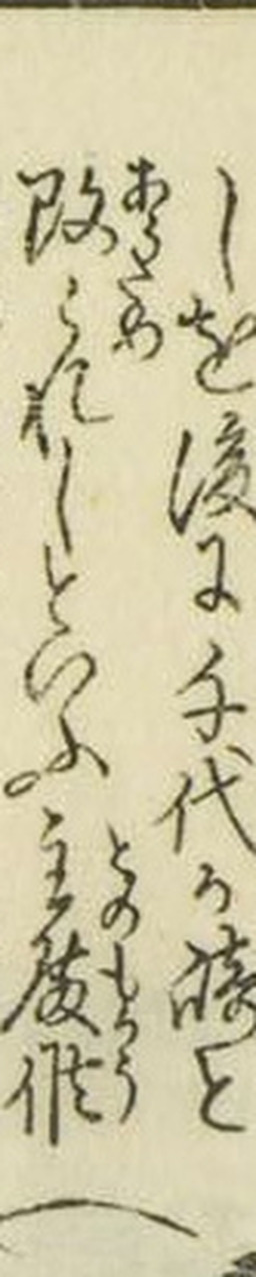改られしといふ主殿侯
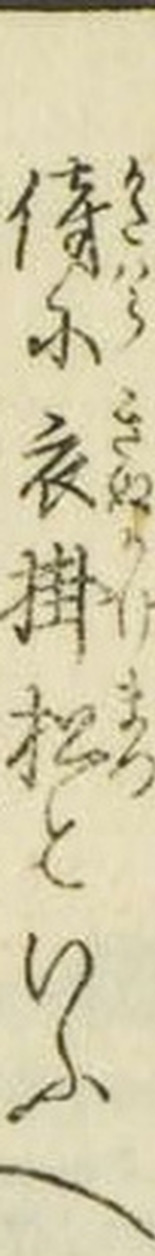傍に衣掛松といふ
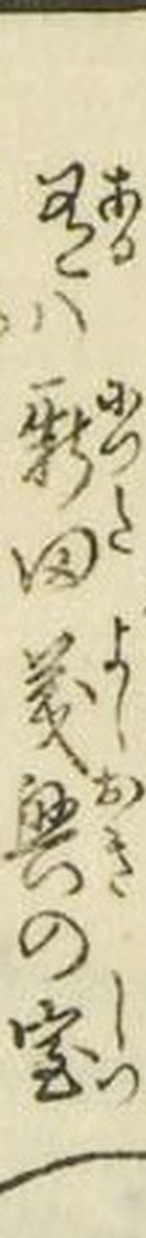有は新田義興の室
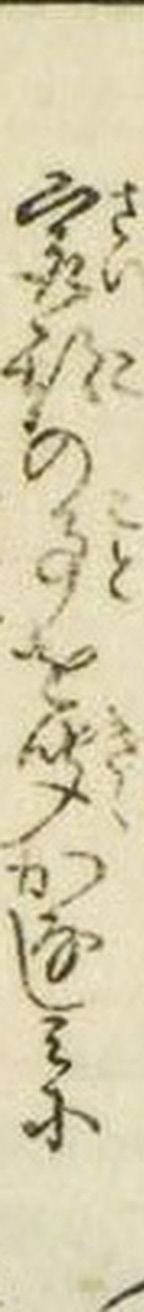最期の事を聞かなしみに
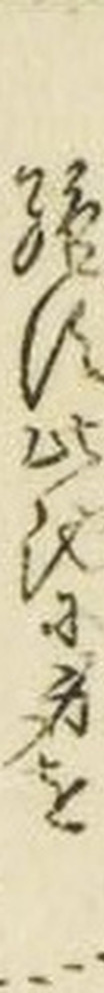絶す此池に身を
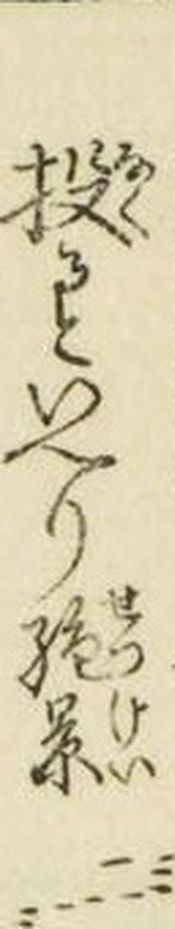投るといへり絶景
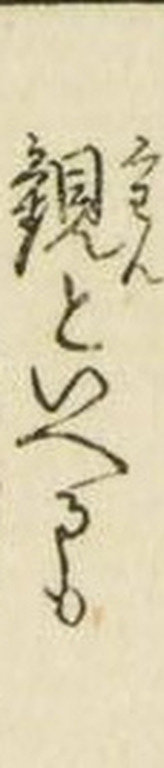観といへるも
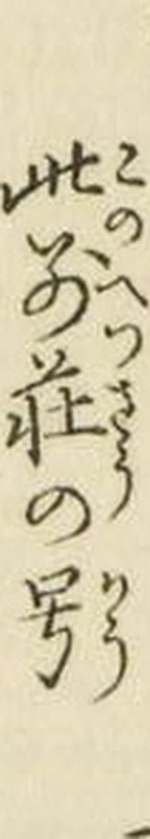此別荘の号
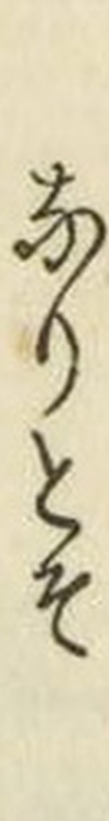なりとそ
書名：江戸名所図会 20巻 巻之7
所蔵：東京学芸大学教育コンテンツアーカイブ
